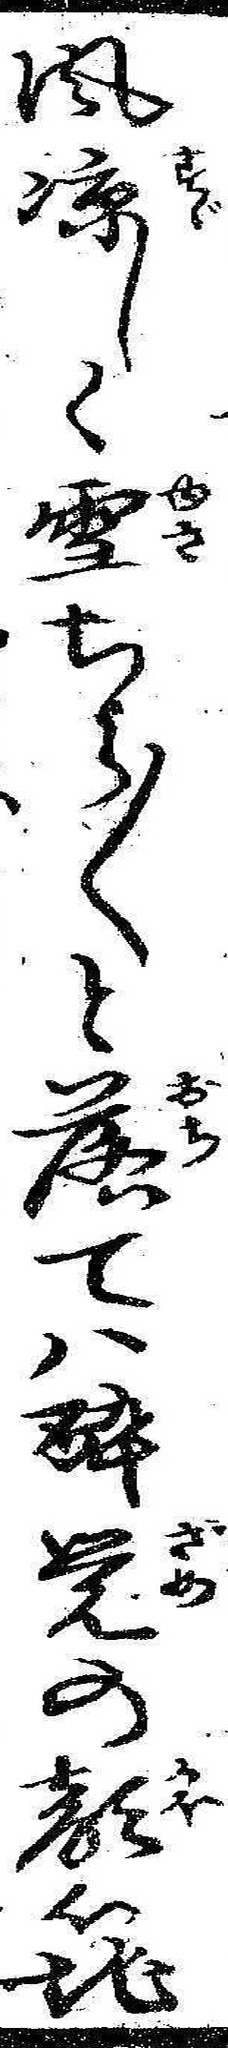風涼しく雪ちら〱と落ては酔覚の顔心地
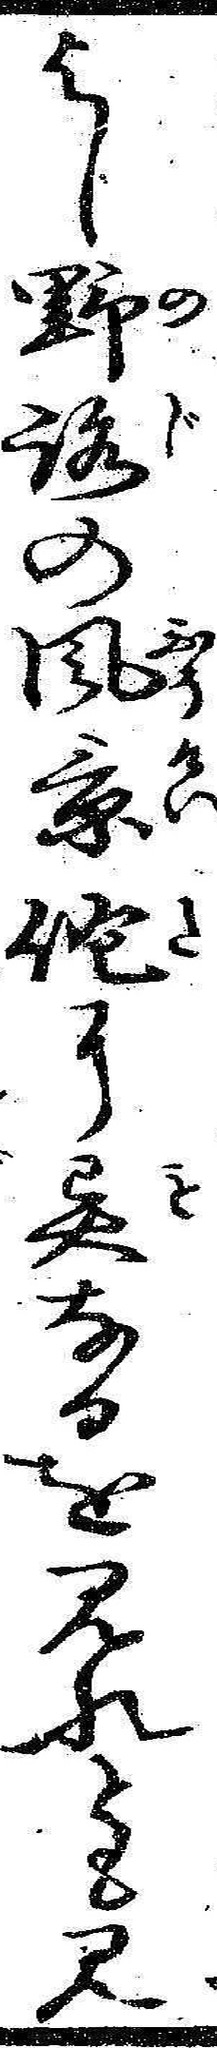よし野路の風景佗に異なるを見れとも見
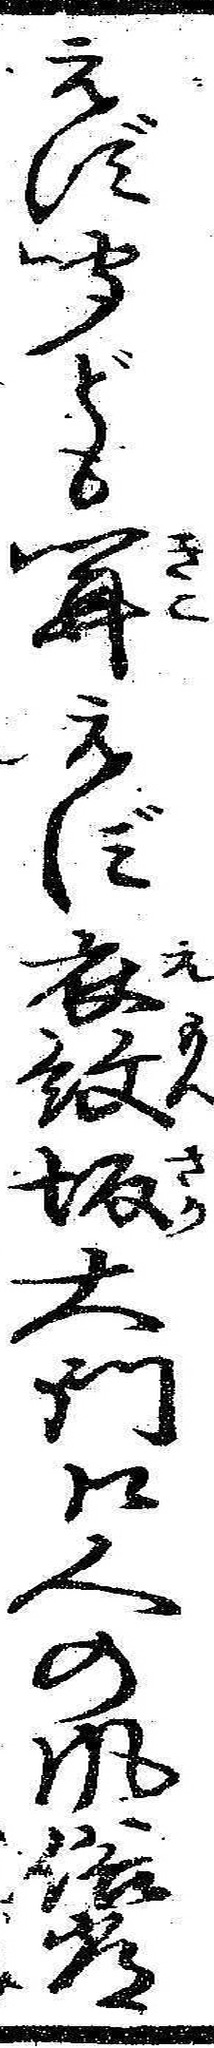えず聞ども聞えず衣紋坂大門口人の風俗常
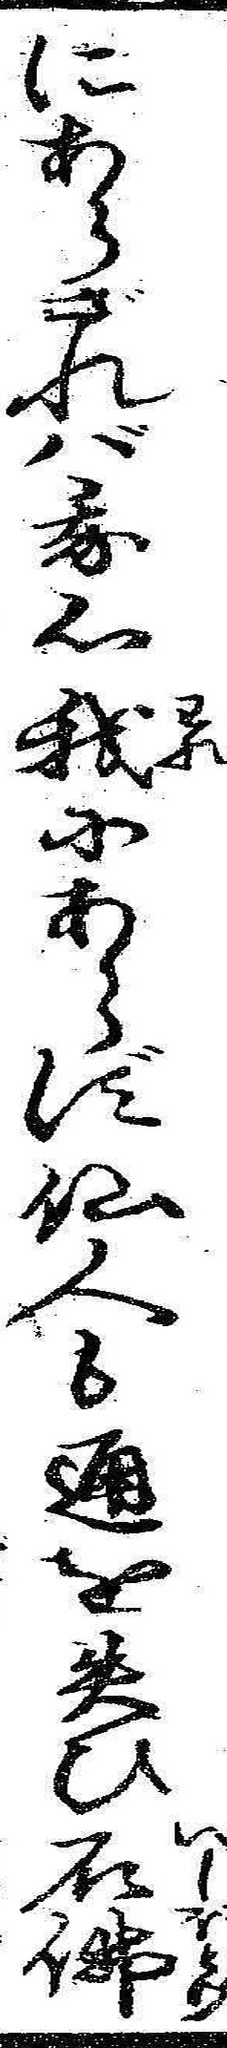にあらざれば我心我にあらず仙人も通を失ひ石仏
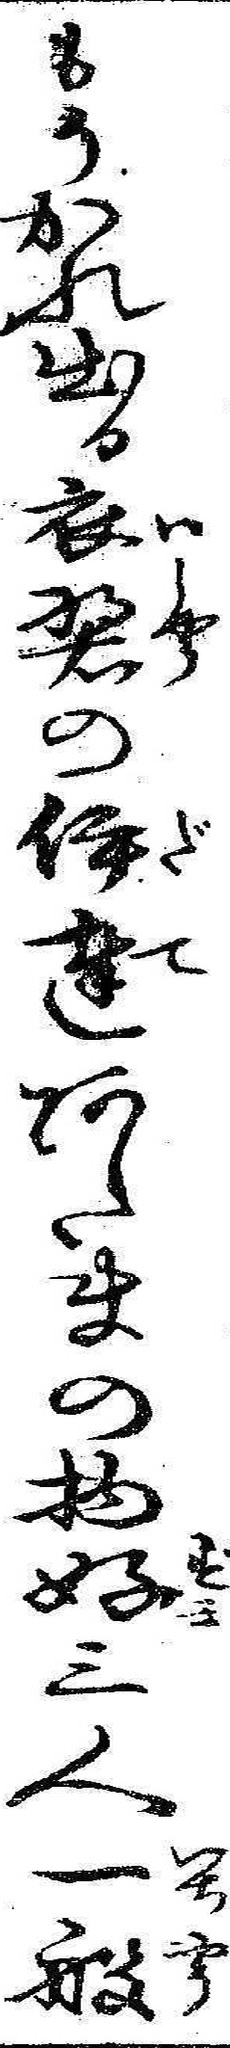もうかれ出る衣装の伊達あたまの物好三人一般
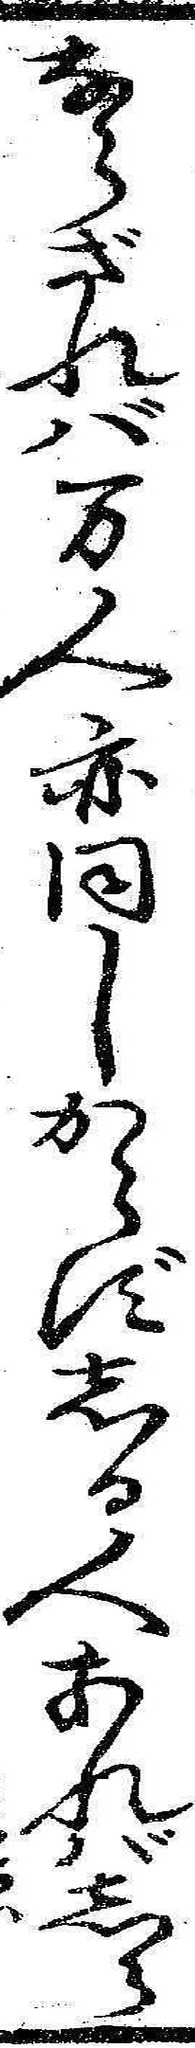ならざれば万人亦同しからずしる人あればしら
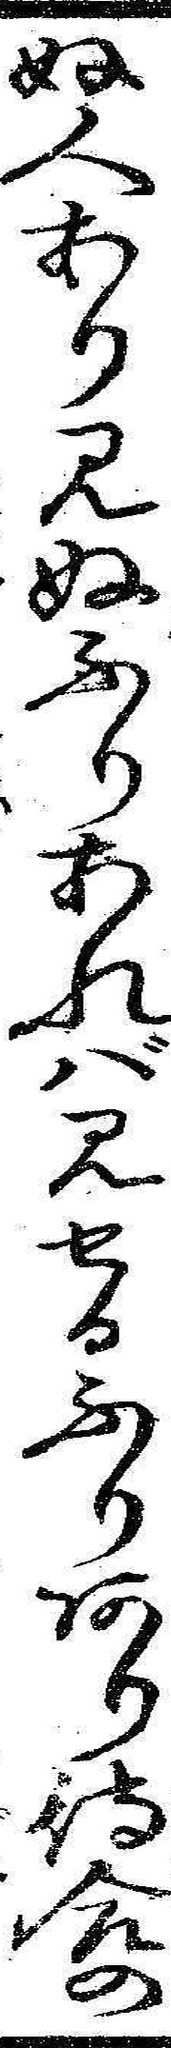ぬ人あり見ぬふりあれば見せるふりあり侍合の
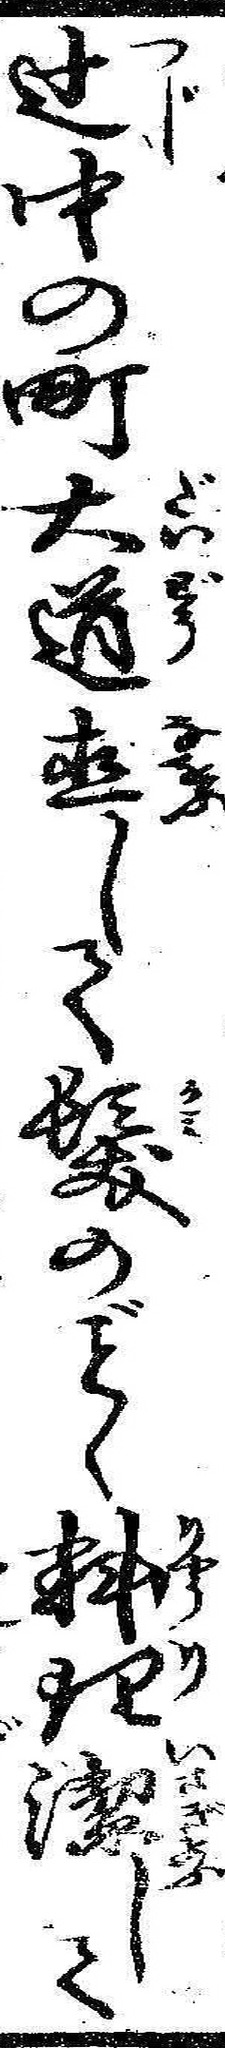辻中の町大道直して髪のごとく料理潔して
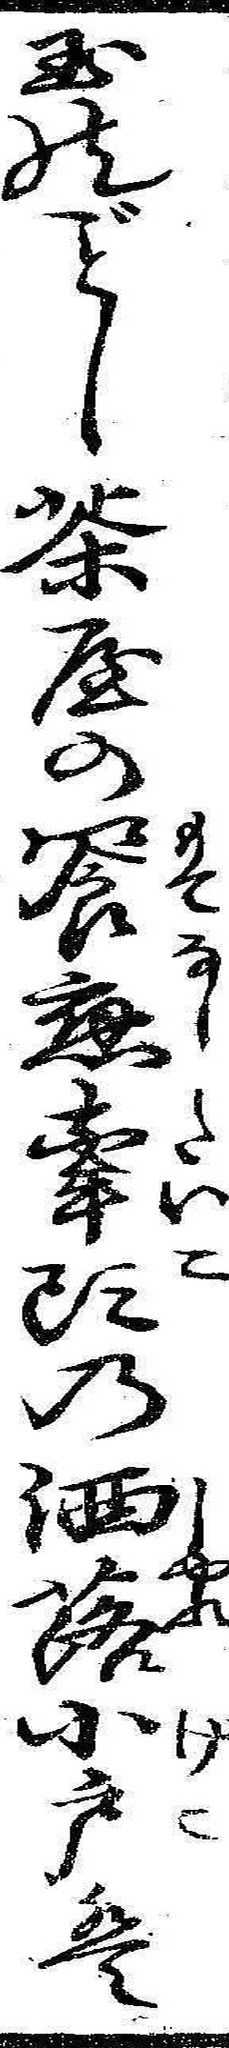玉のごとし茶屋の饗応牽頭の洒落小戸は
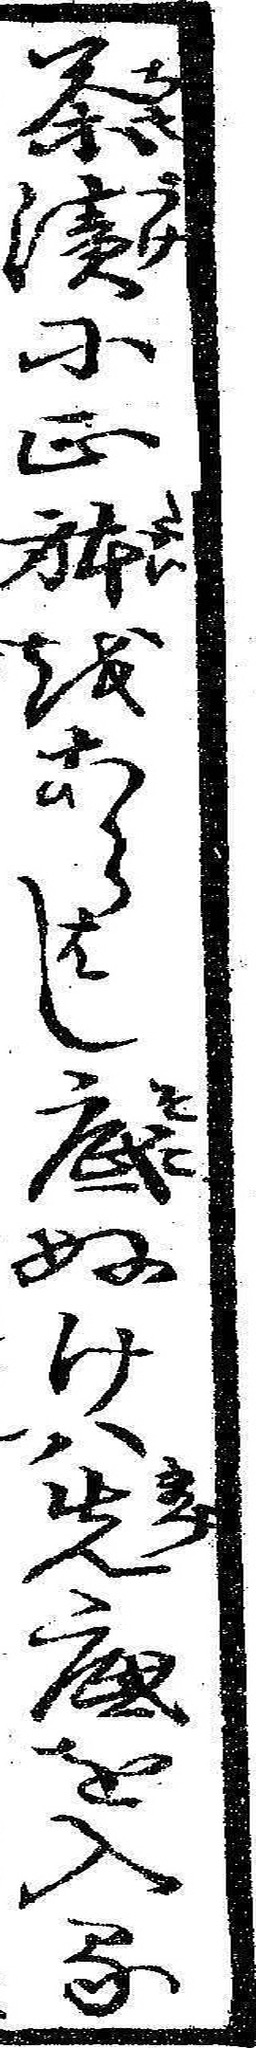茶漬に正体をあらはし底ぬけは先底を入る
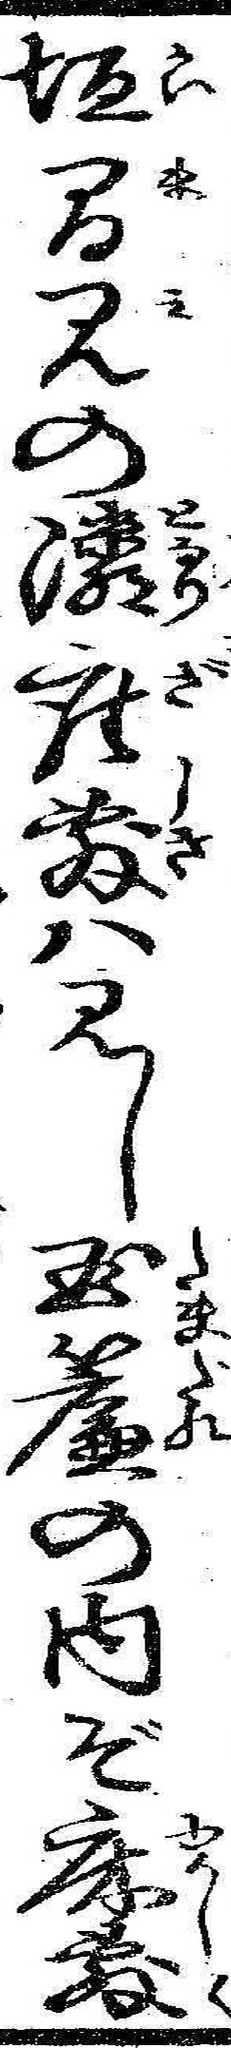垣間見の隣座敷は見し玉簾の内ぞ床敷
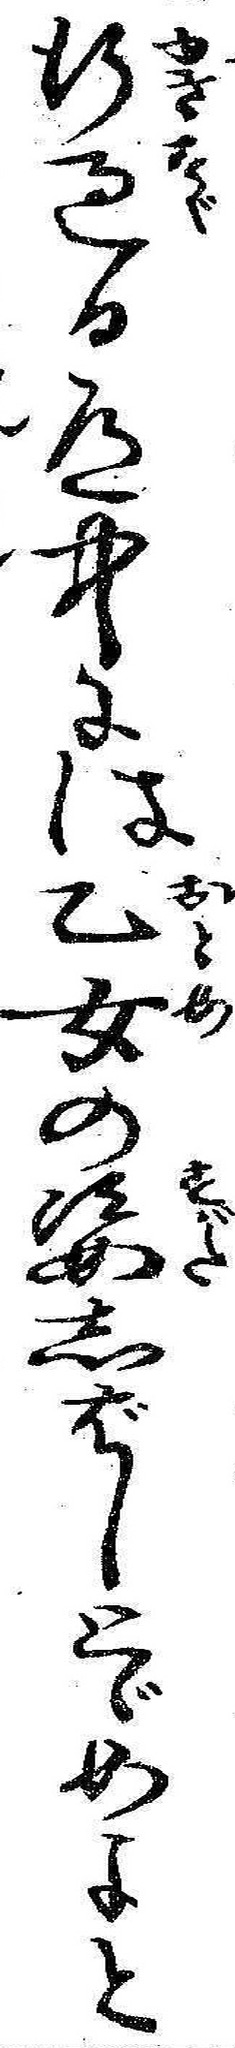行過る道中には乙女の姿しばしとゞめよと
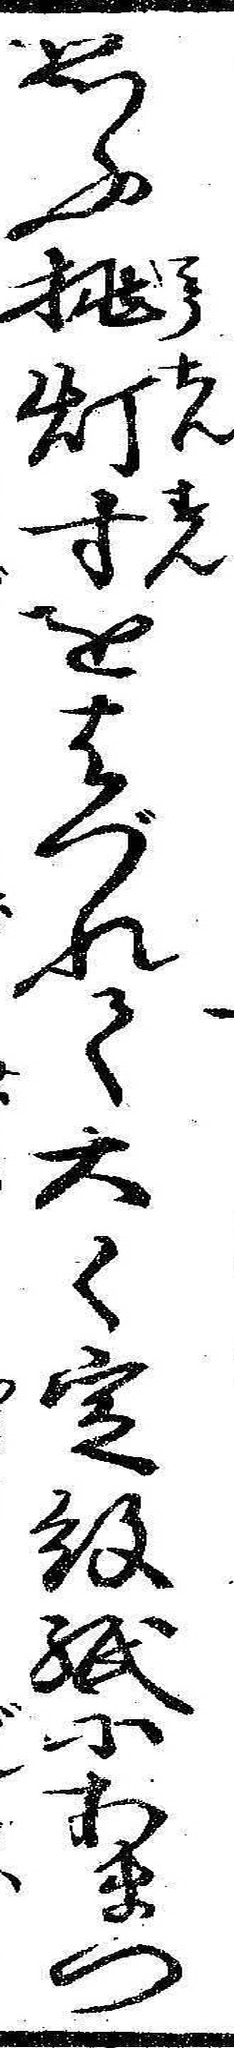思ふ挑灯寸をはづれて大く定紋紙にあまつ
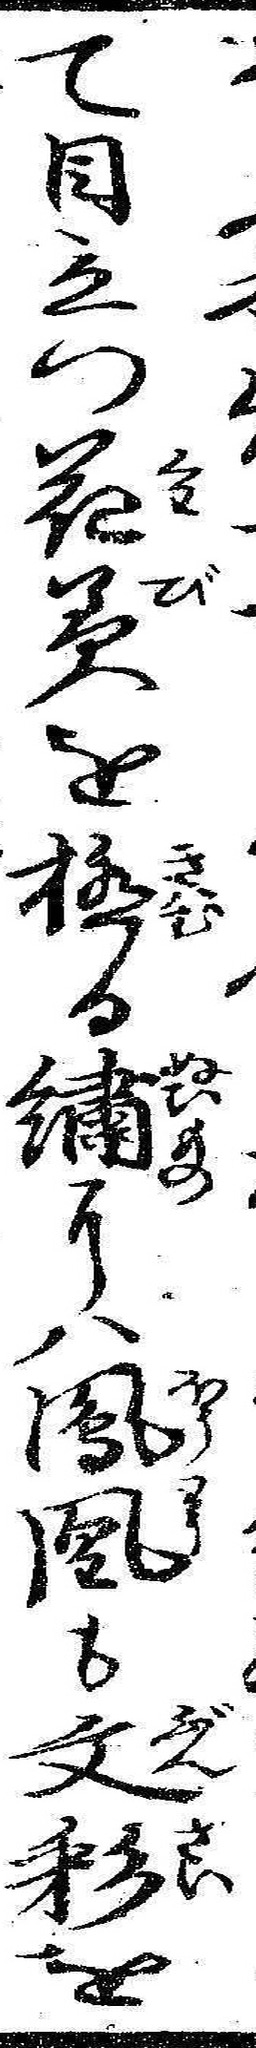て目立つ花美を極る繍には鳳凰も文彩を
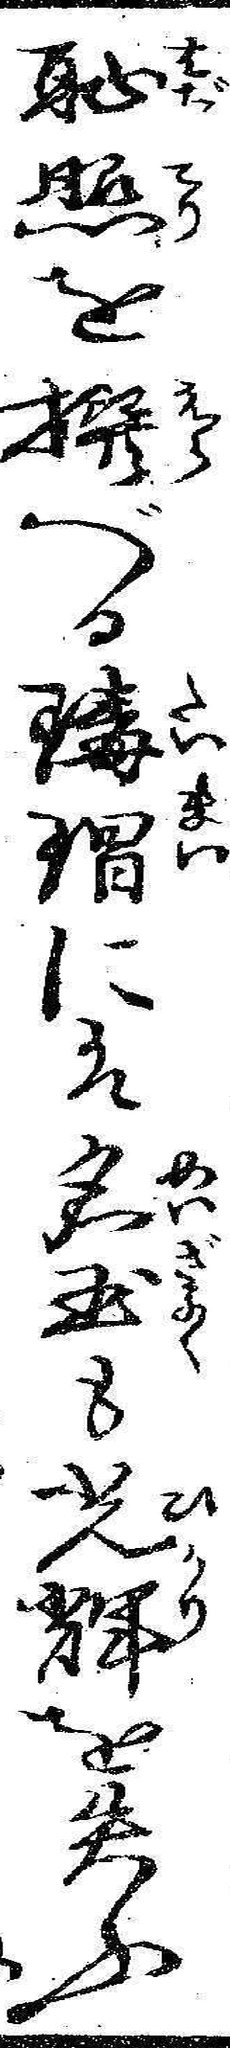恥照を撰べる瑇瑁には名玉も光輝を失ふ
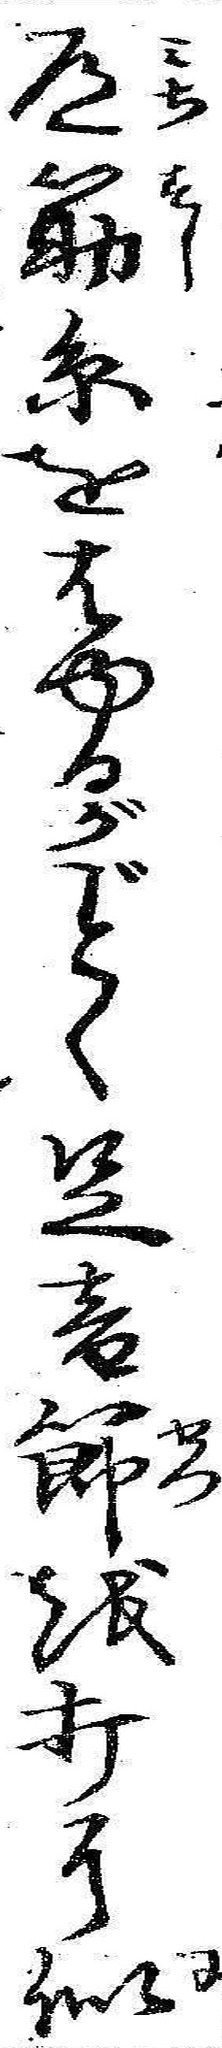道筋糸をはゆるがごとく足音節を打に似
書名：根無草後編
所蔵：国文学研究資料館
